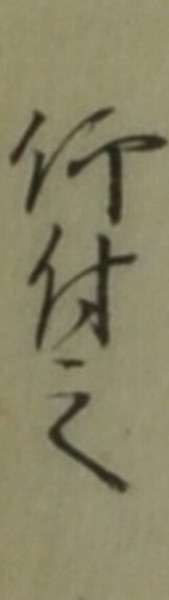仰付之
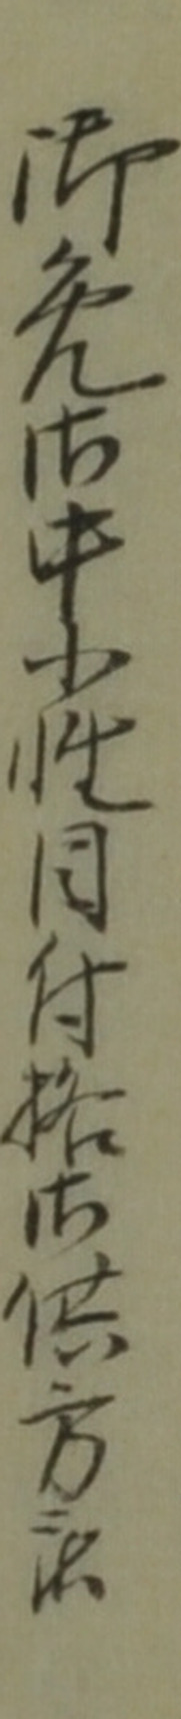御免御中小性目付格御供方被
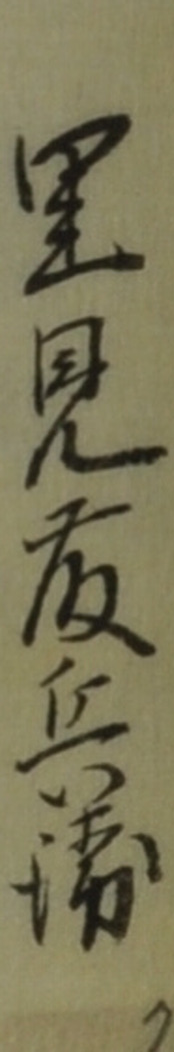里見藤兵衛
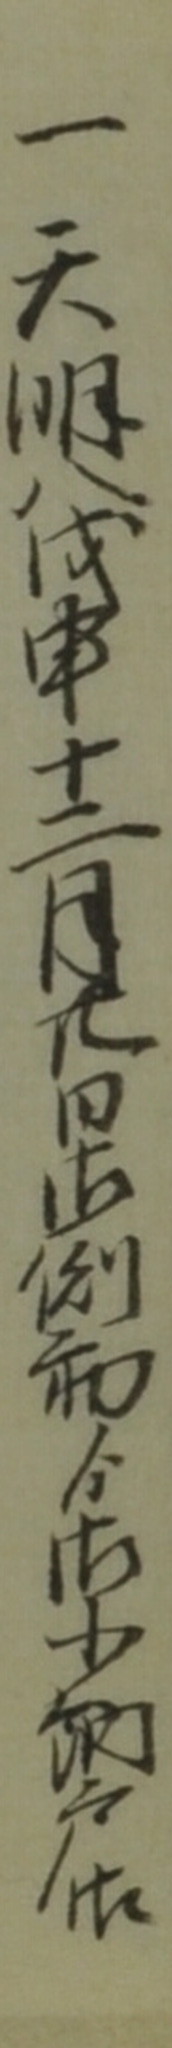一天明八戊申十二月廿日御側勤ゟ御小納戸御
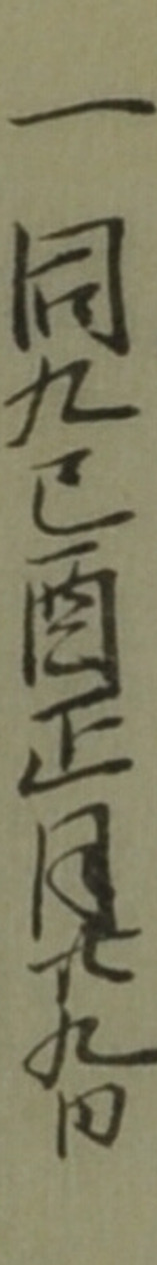一同九己酉正月廿九日
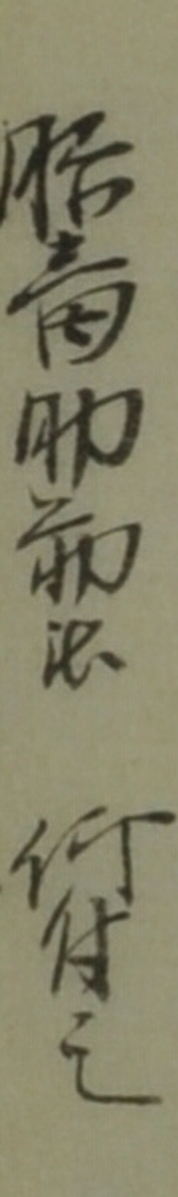膳番助勤被仰付之
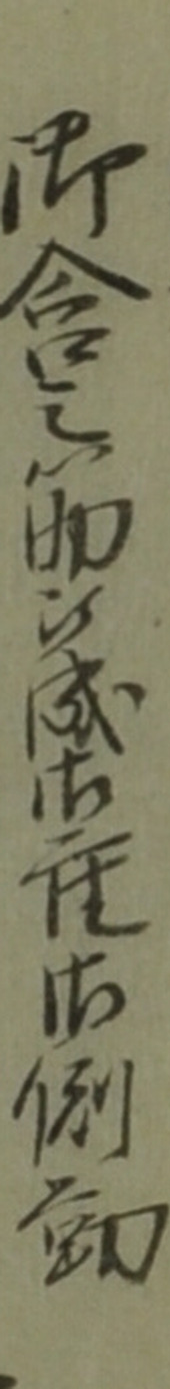御含之筋被成御座御側勤
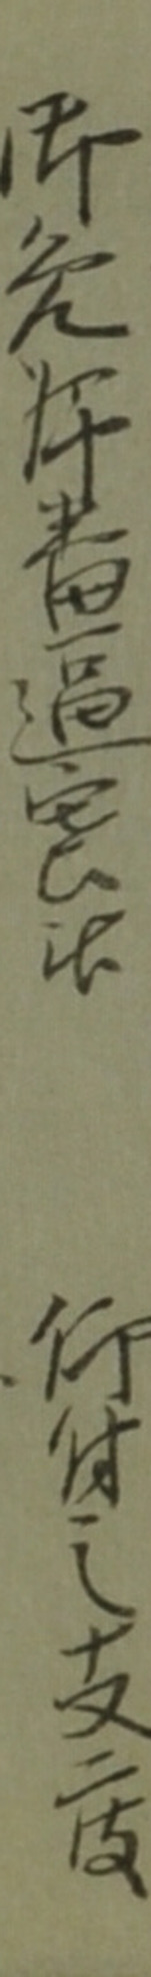御免帰番逼塞被仰付之仕度
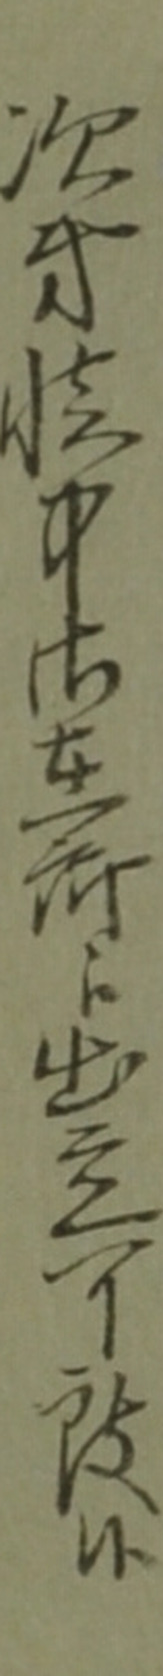次第慎中御在所江出立可致候
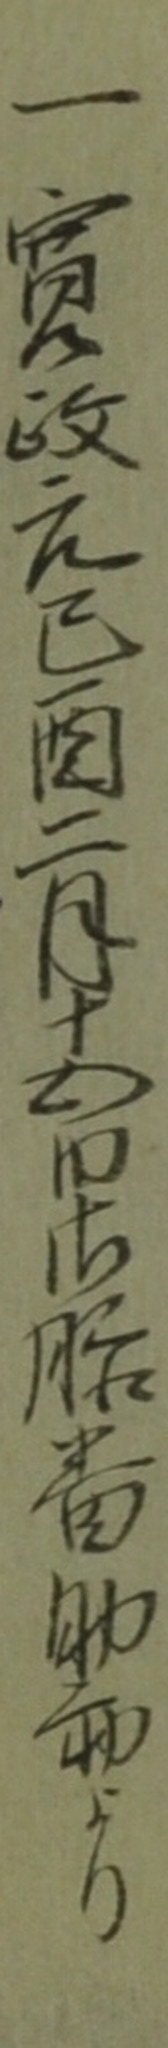一寛政元己酉二月十五日御膳番助勤より
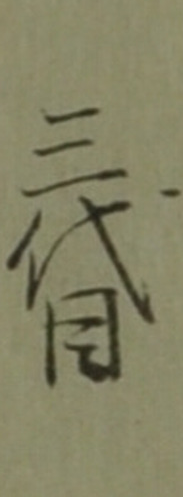三代目
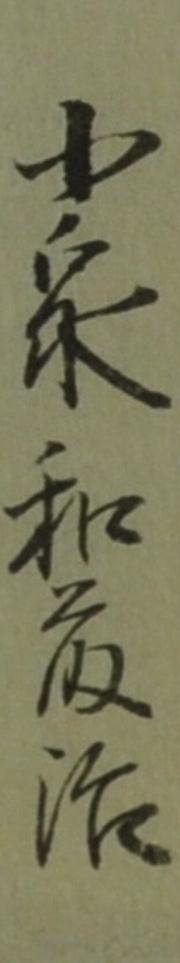小泉和藤治
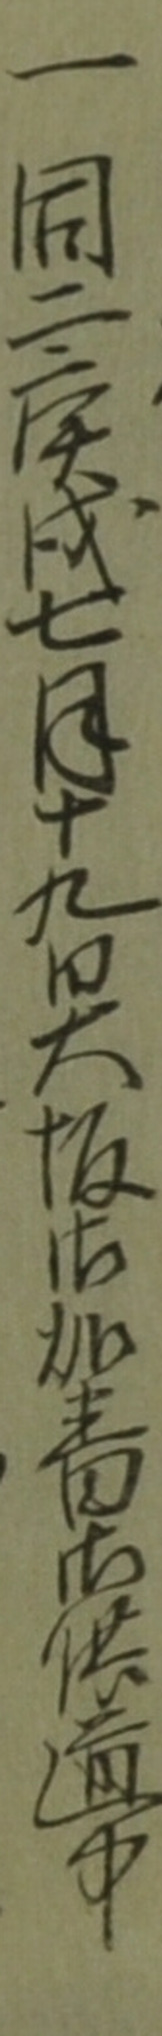一同二庚戌七月十九日大坂御加番御供道中
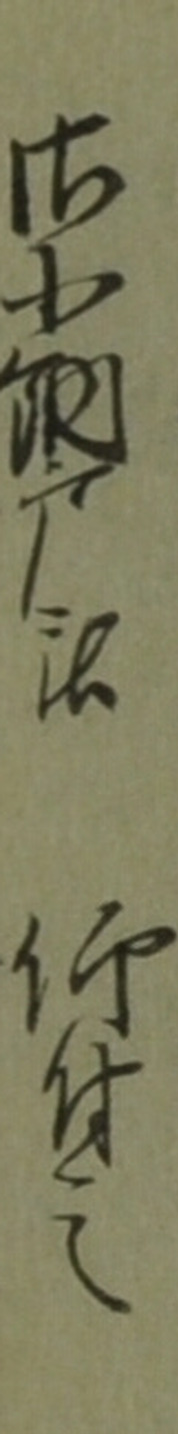御小納戸被仰付之
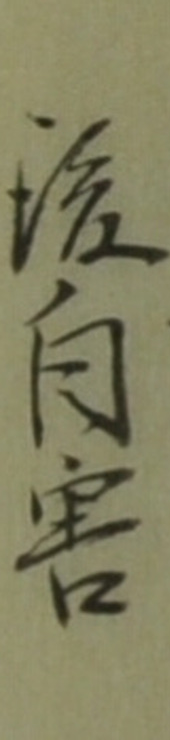後自害

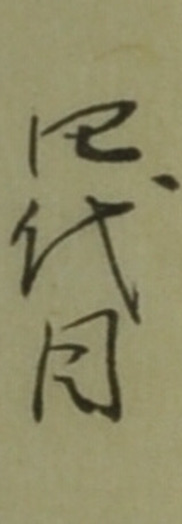四代目
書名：諸御役代々録（四）
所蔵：伊那市立高遠町図書館・合同会社AMANE
